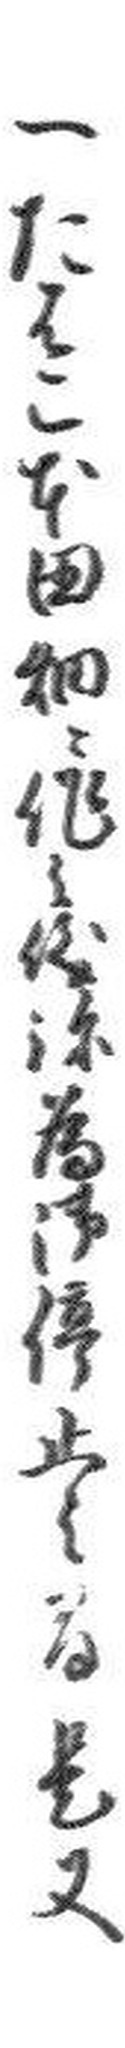一たはこ本田畑ニ作之儀弥為御停止之間是又
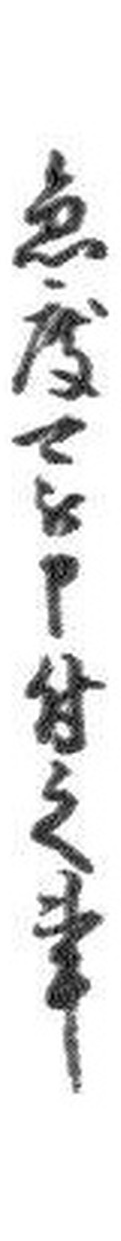急度可被申付之事
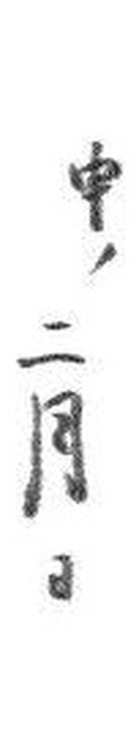申ノ二月日
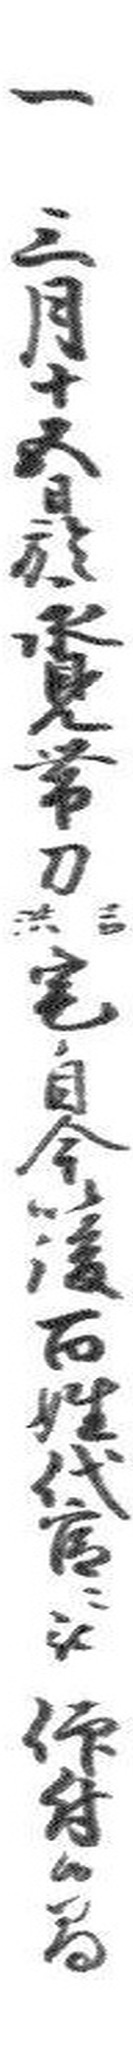一三月十五日於永見帯刀吉洪宅自今以後百姓代官ニ被仰付候間
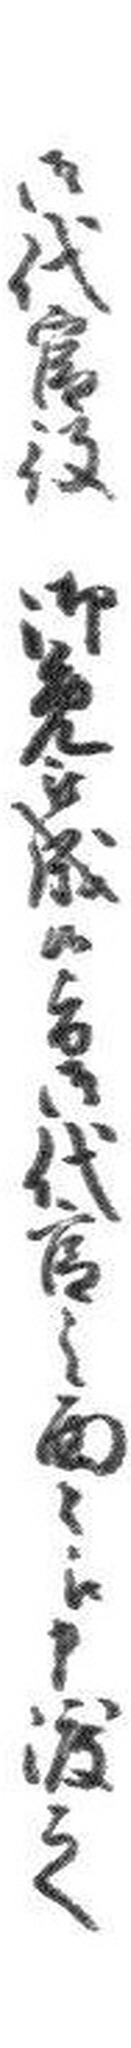御代官役御免被成候旨御代官之面々江申渡之
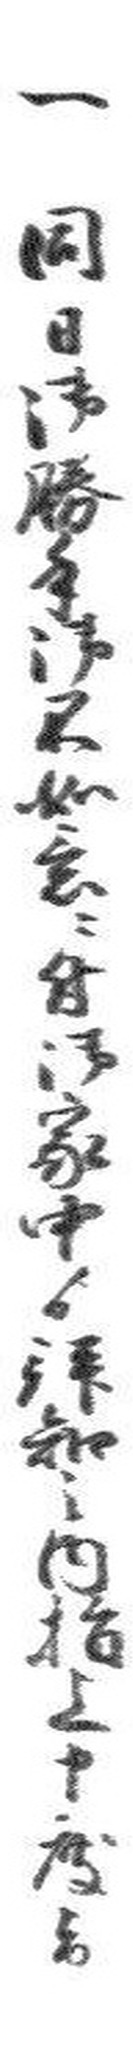同日御勝手御不如意ニ付御家中ゟ拝知之内指上申度旨
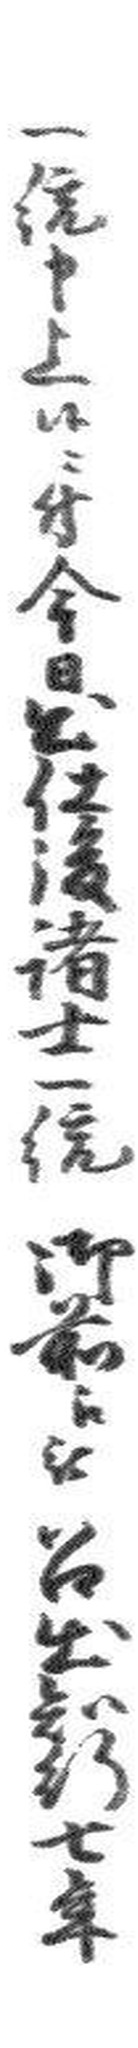一統申上候ニ付今日出仕後諸士一統御前江被召出知行七年
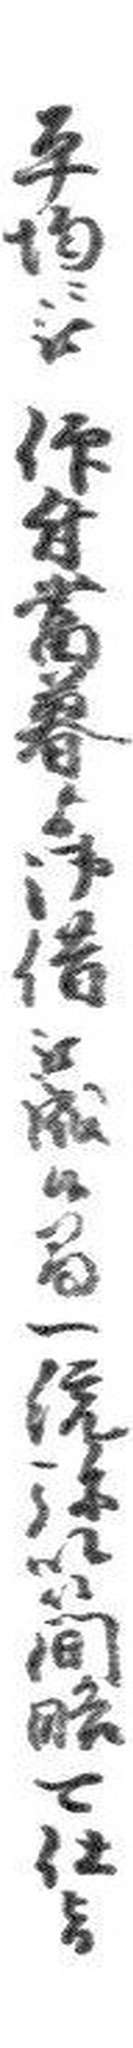平均ニ被仰付当暮ゟ御借被成候間一統弥以簡略可仕旨

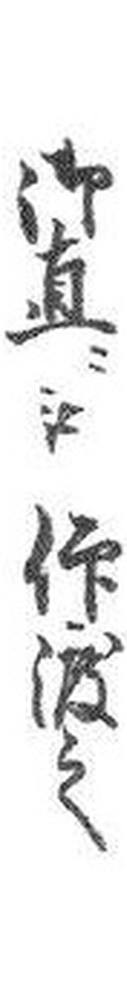御直ニ被仰渡之
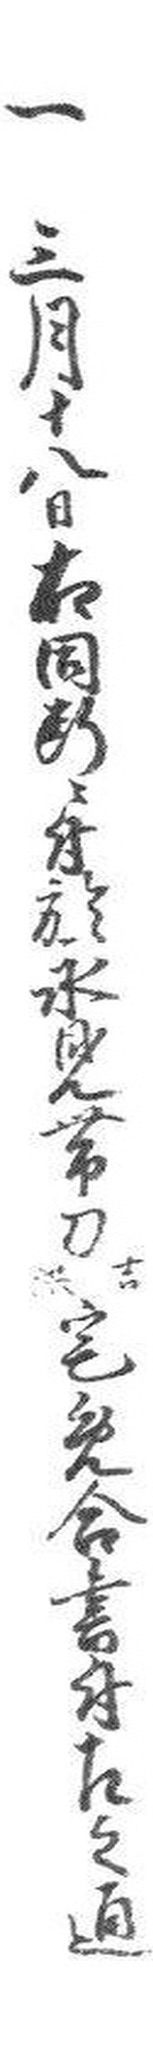一三月十八日右同断ニ付於永見帯刀吉洪宅免合書付左之通
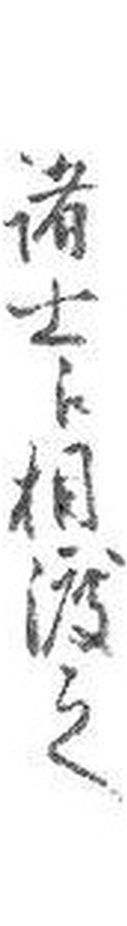諸士江相渡之
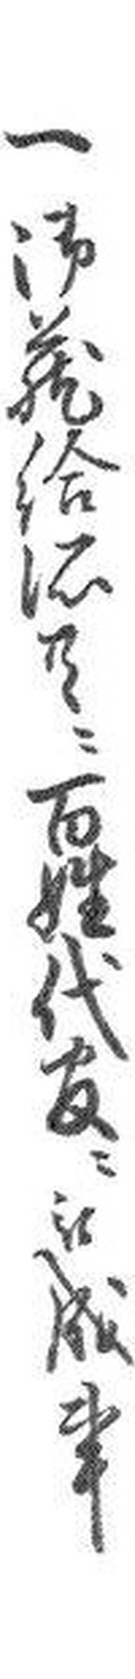一御蔵給所共ニ百姓代官ニ被成事
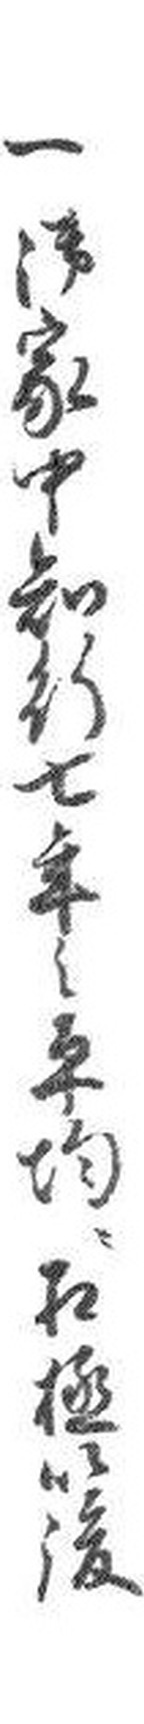一御家中知行七年之平均ニ相極以後
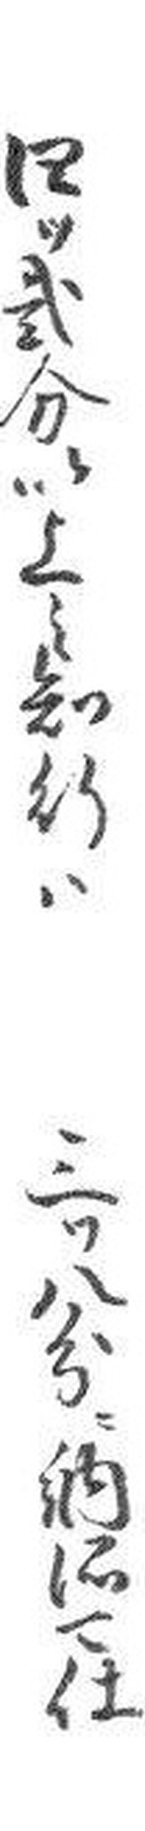四ツ弐分以上之知行ハ三ツ八分ニ納所可仕
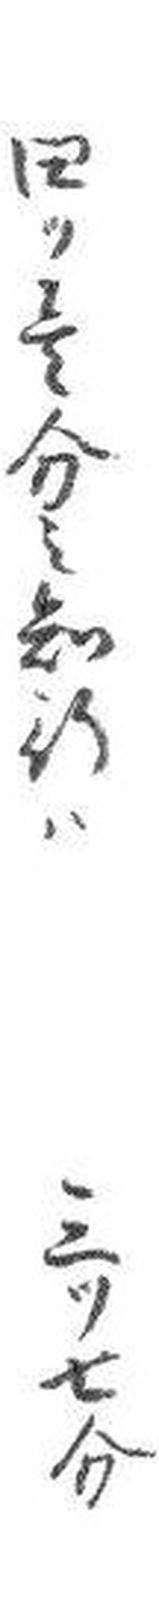四ツ壱分之知行ハ三ツ七分
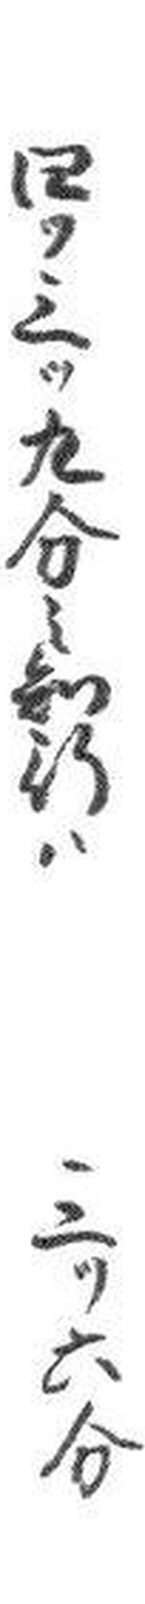四ツ三ツ九分之知行ハ三ツ六分
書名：家譜 七 光通公 従寛文四年到同九年
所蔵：福井県文書館 Fukui Prefectural Archives
